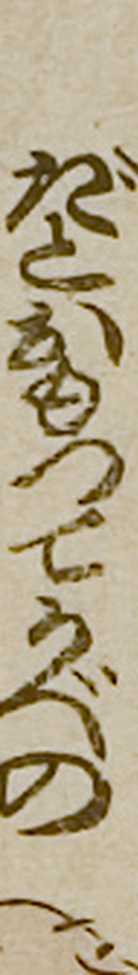だとおもつてかべの
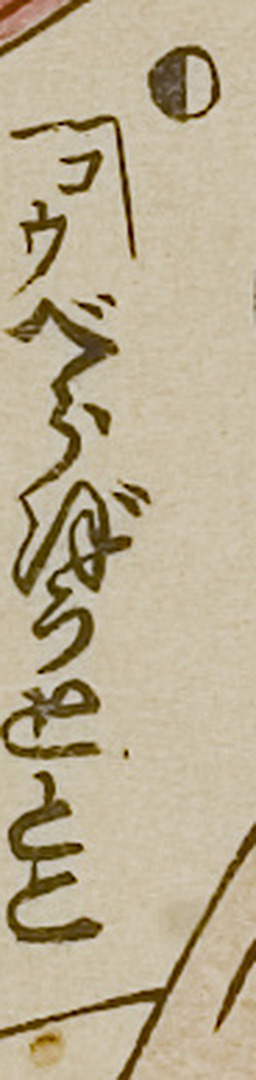〽コウべらぼうをとこ
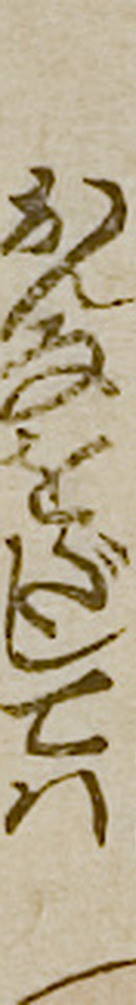おんなをだしては
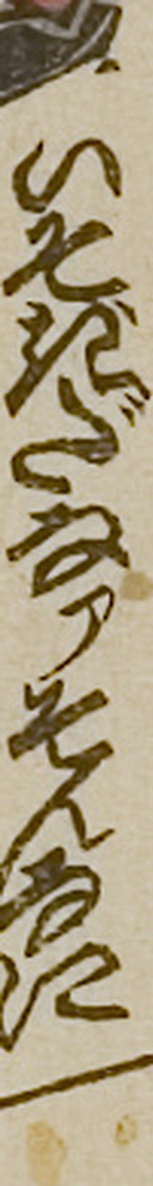いそぎだなアそんなに
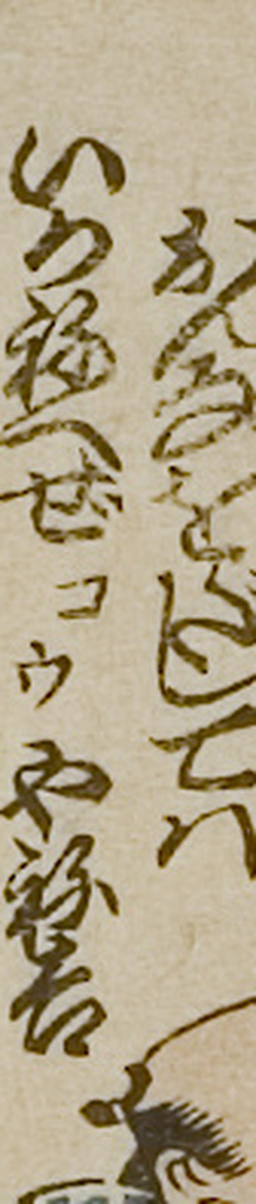いかねへぜコウやね吉
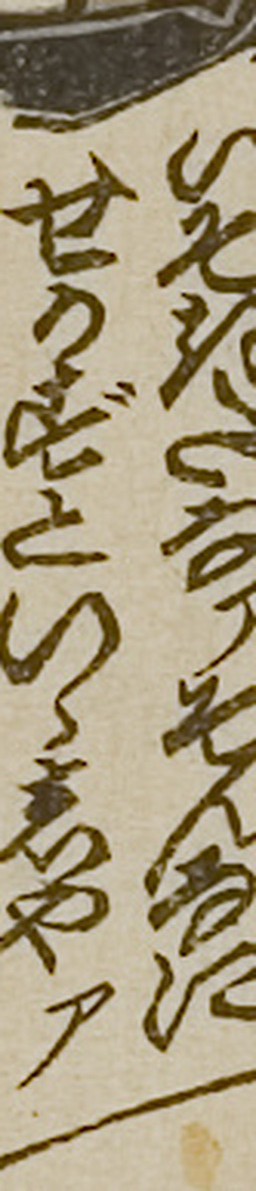せかずといゝしやア
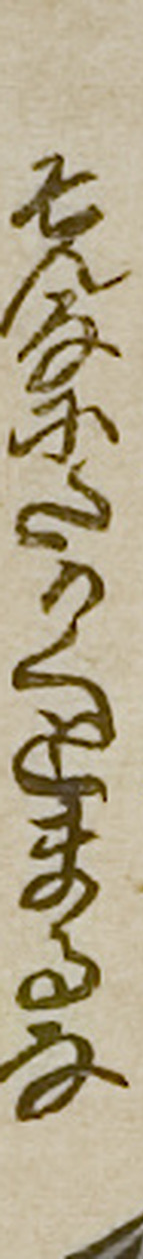そんなにたかくとまるな
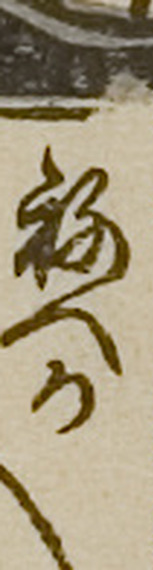ねへか
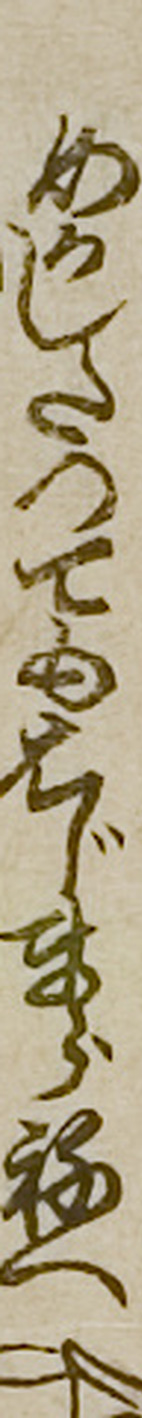めかしたつてもはじまらねへ
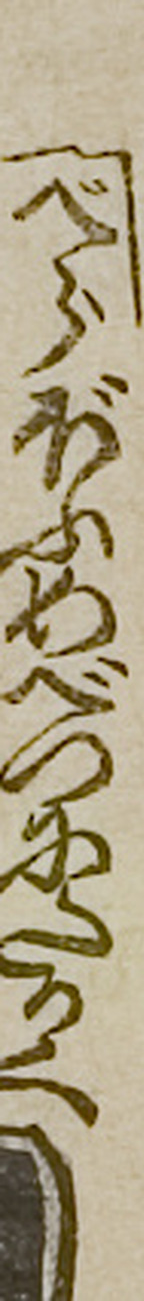〽べらぼふめべつにたかく
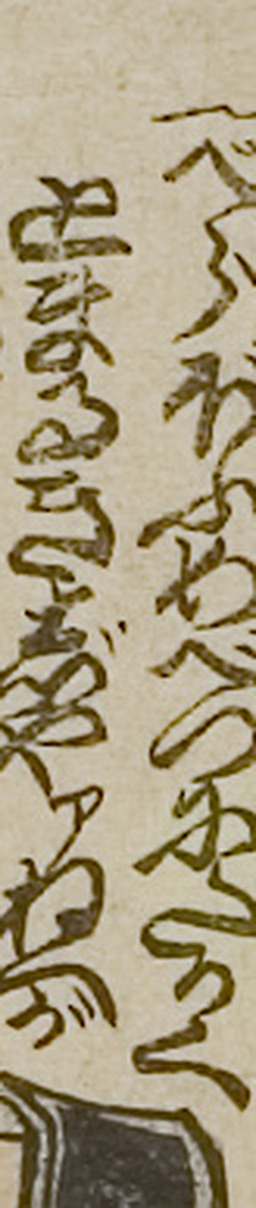とまるきじやアねへが
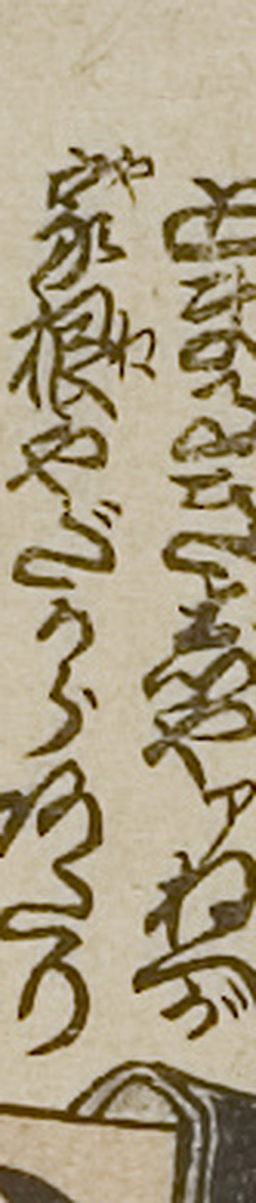家根やだからあたり
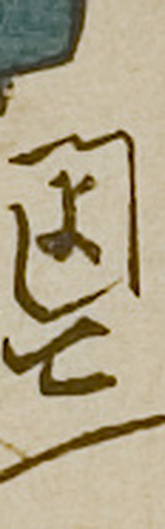〽よして
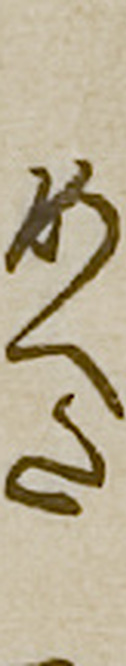めへた
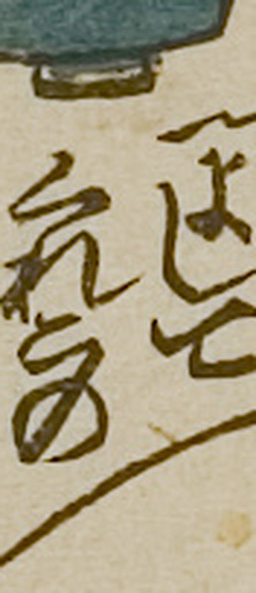くれこの
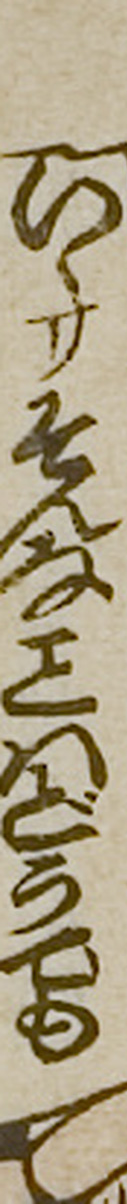〽いゝサそんなことはどうでも
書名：瓢箪
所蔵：東京大学総合図書館 General Library in the University of Tokyo, JAPAN
